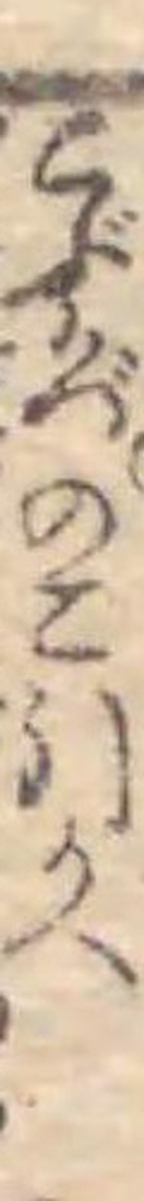こぶかづのこ引かへ
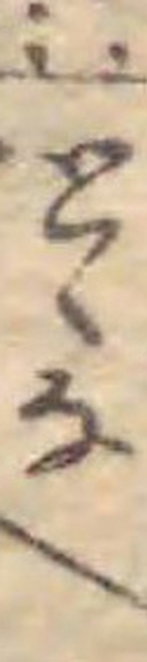とくな
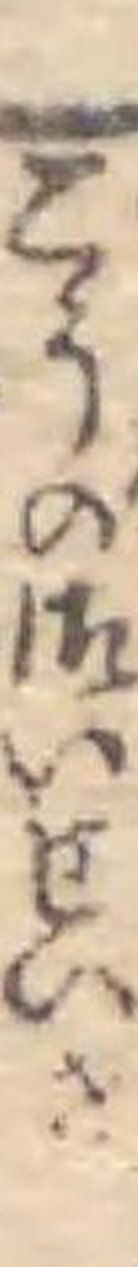こうの御いせいを
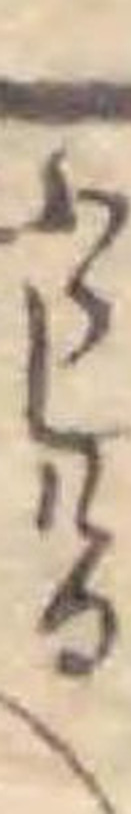ふらしける
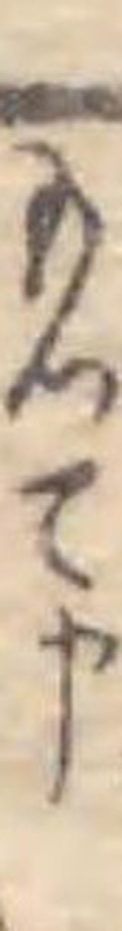もつて申
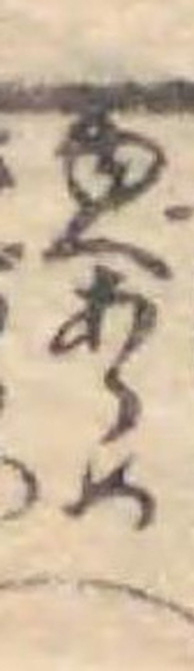ゆへあらめ
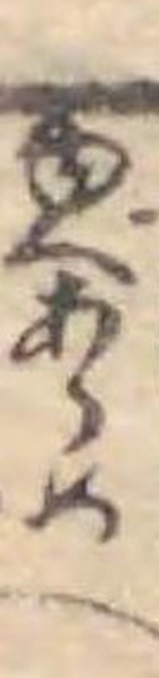ゆへあらめ
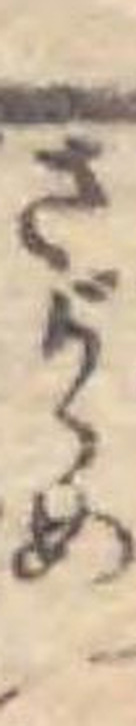さがらめ
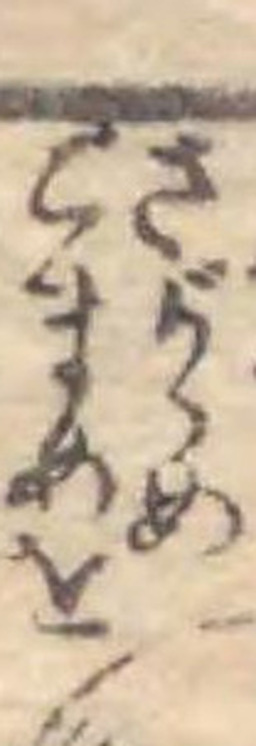ごまめを
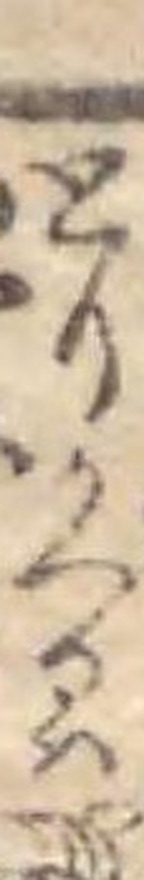とりかへるは
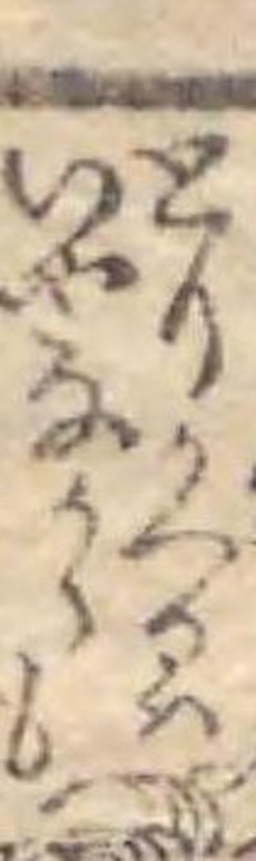いやなからも
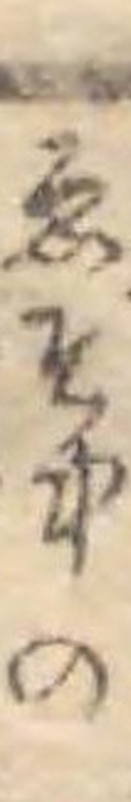ゑそ中の
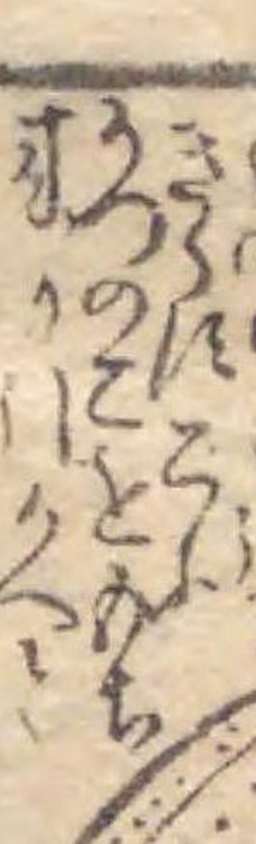かつのこをもち
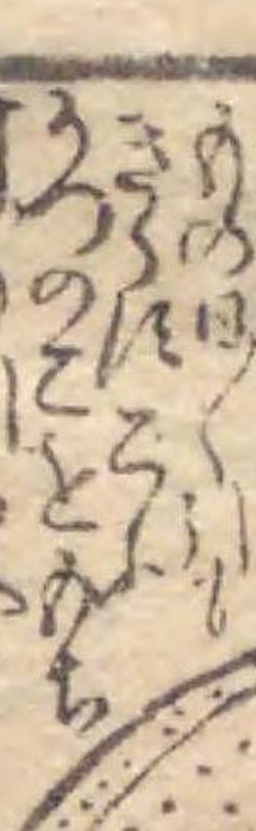かつのこをもち
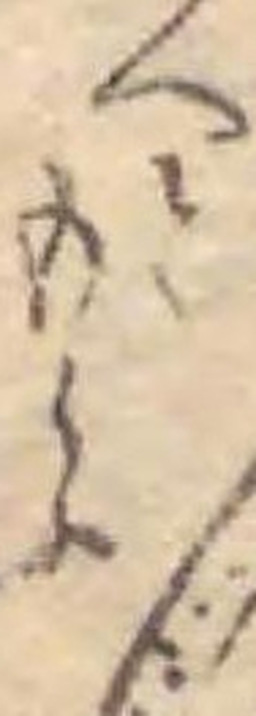もらふ
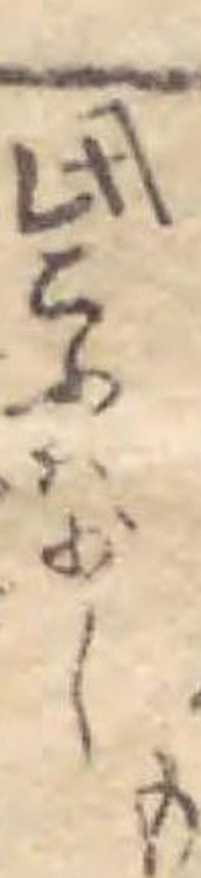〽此こふは少し
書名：悦贔負蝦夷押領 : 3巻
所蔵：国立国会図書館 National Diet Library, JAPAN
